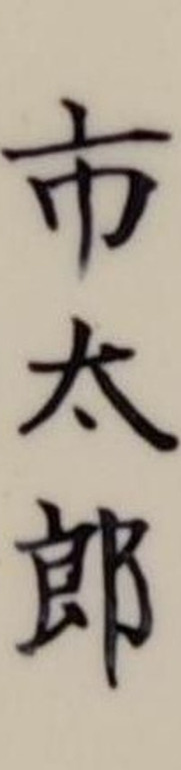市太郎
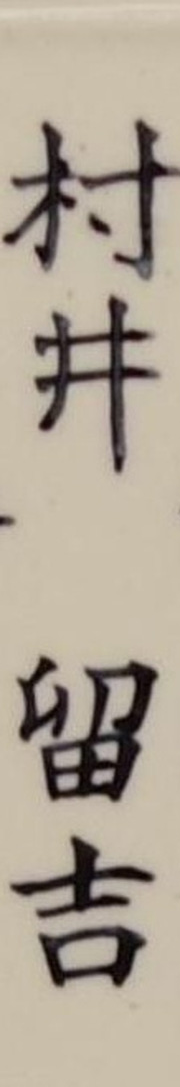村井留吉
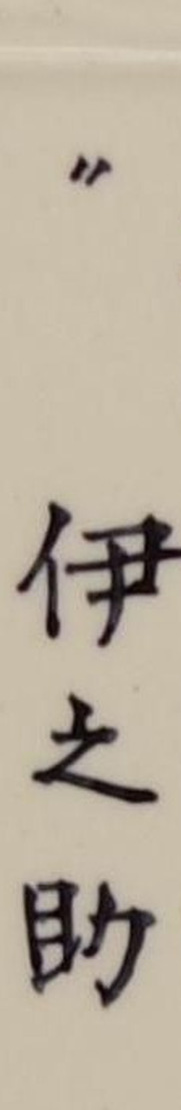伊之助
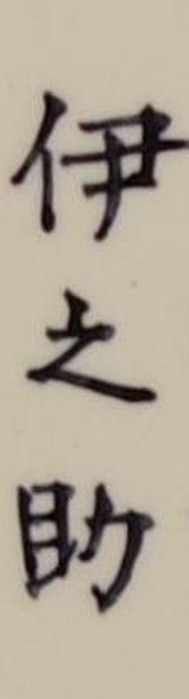伊之助
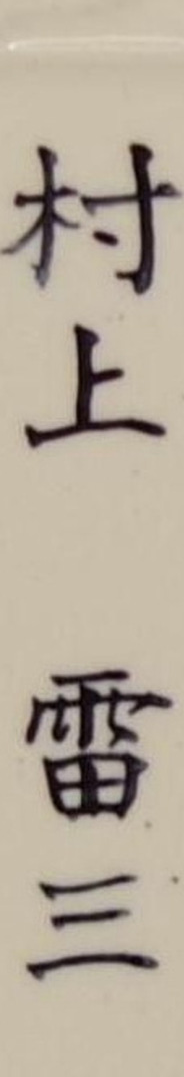村上雷三
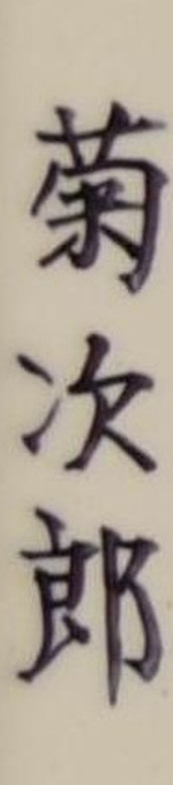菊次郎

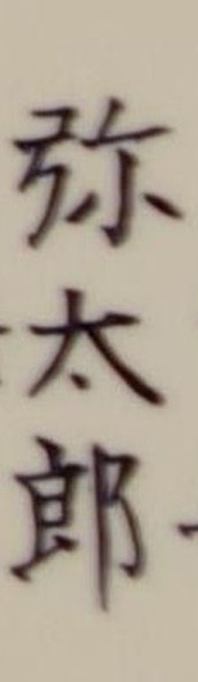弥太郎
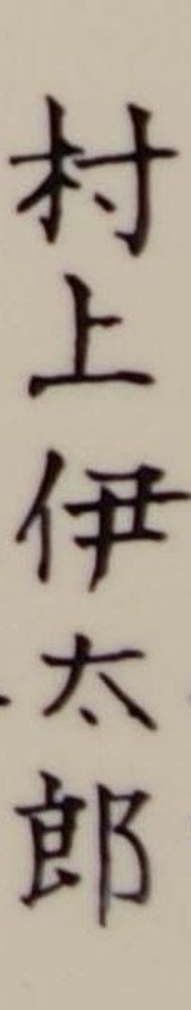村上伊太郎
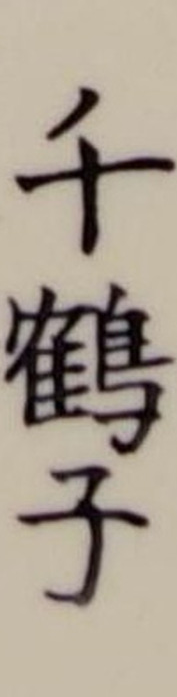千鶴子
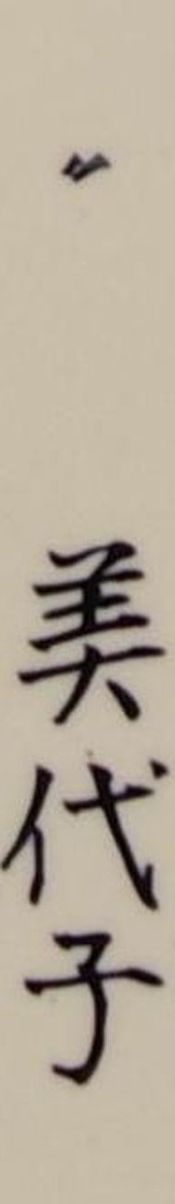美代子
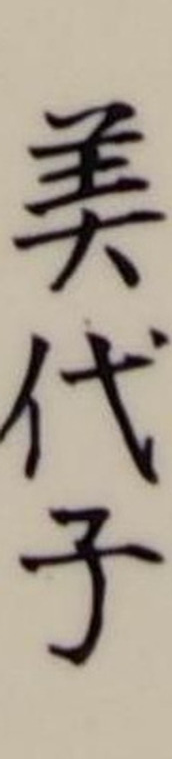美代子
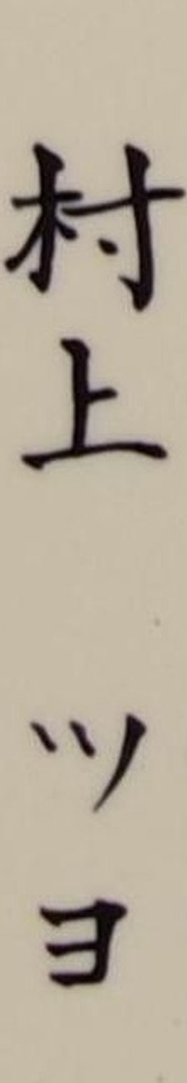村上ツヨ
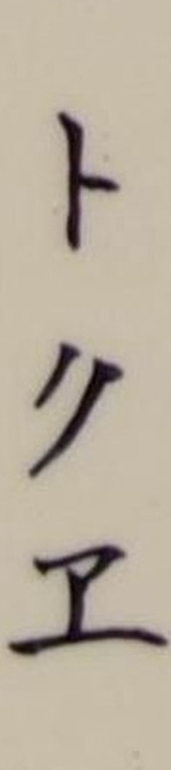トクエ
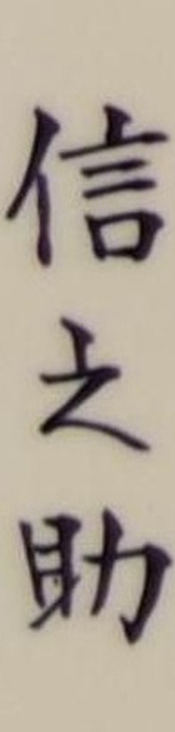信之助

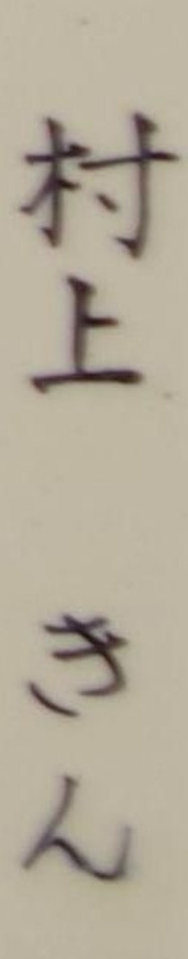村上きん
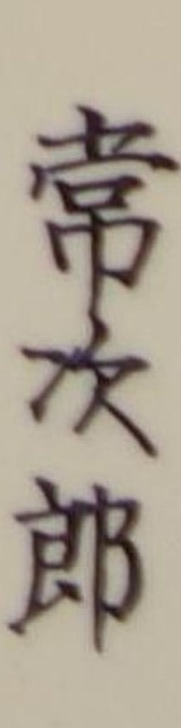常次郎
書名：M~S
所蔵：高野山金剛峯寺
